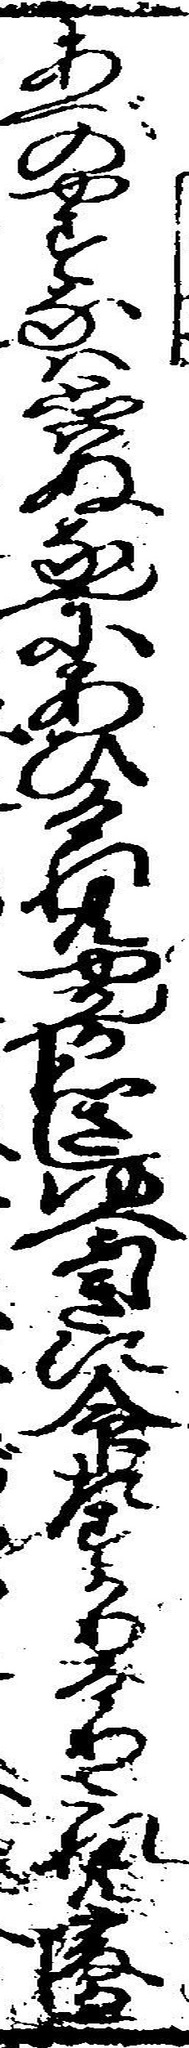あへのやすなは思はぬなんにあひけれ共やかんか心さしゆへふしきに命たすかりけりされ共爰かし
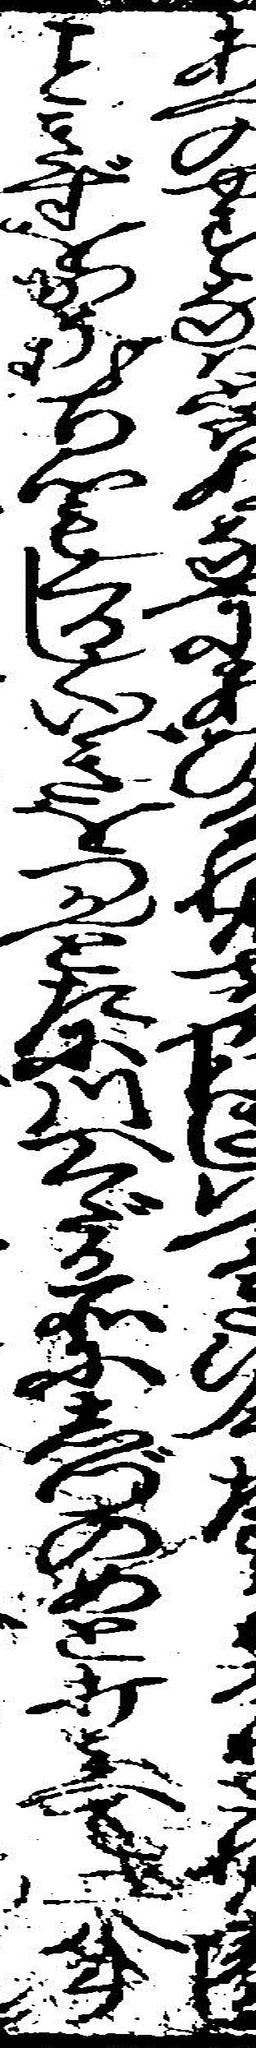こときずをかうむり心もくるしくいきをつかんとたに川へくだる所にしづのめと打みへて二八斗
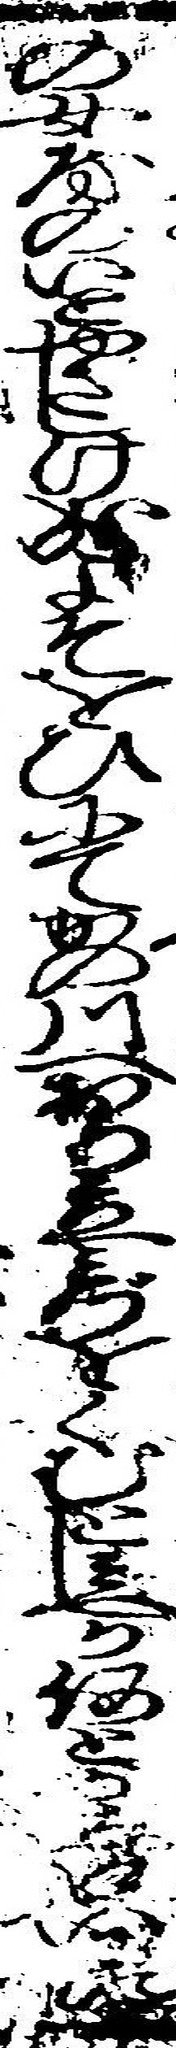の女房のいとやさしけ成よそをひにてかの川へおり立みづをくむとみへしか何とかに
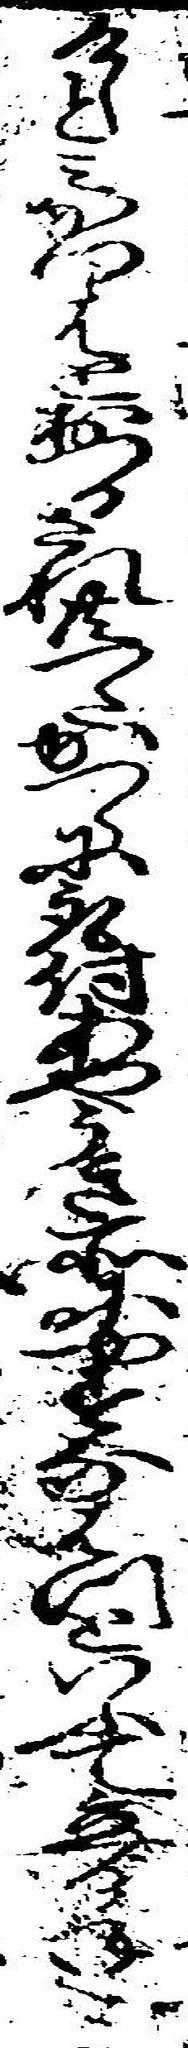けしとみかつはとおつるされ共つたかつらに取付あやうき所にやすなはつといふて立ゟ
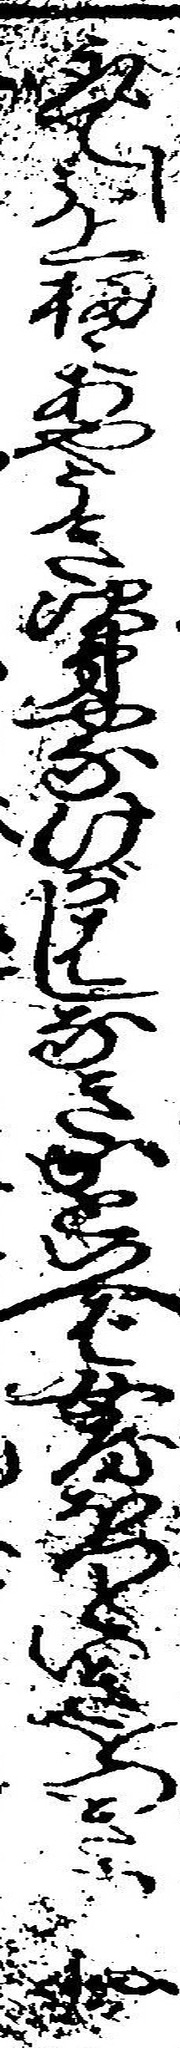取て引上扨々あやうき次第やなけがはしなきかといへば女房ほつといきをつき
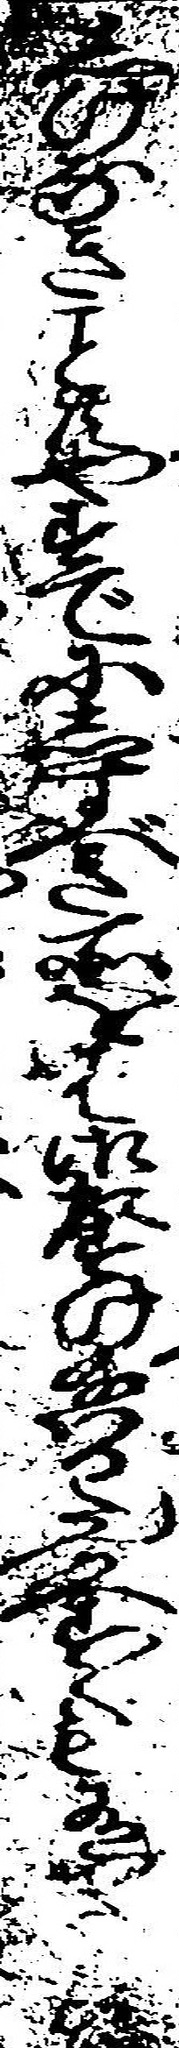しけなきこと共やすでにしすべき所をば御たすけ給はるたんかへす〳〵も有り

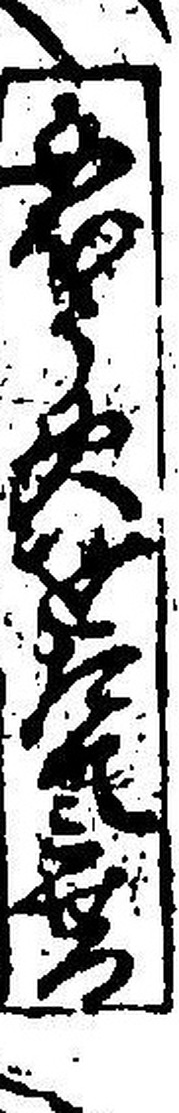女ほう火をたてみせる
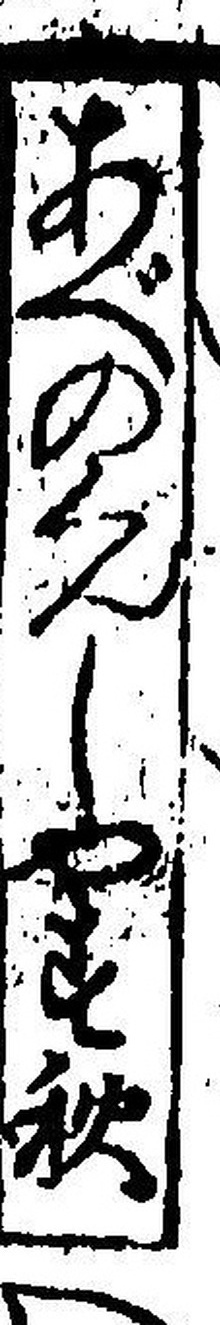あべのくんしやす秋

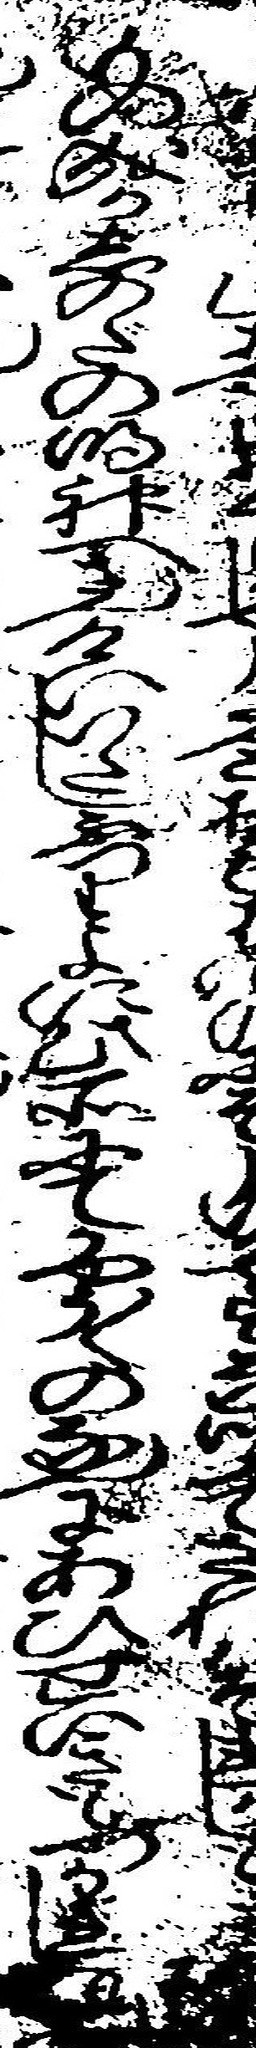もの成か？しのだの明神へさんけいいたしふりよに此所にてかやう〳〵のなんにあひせいきもつかれし
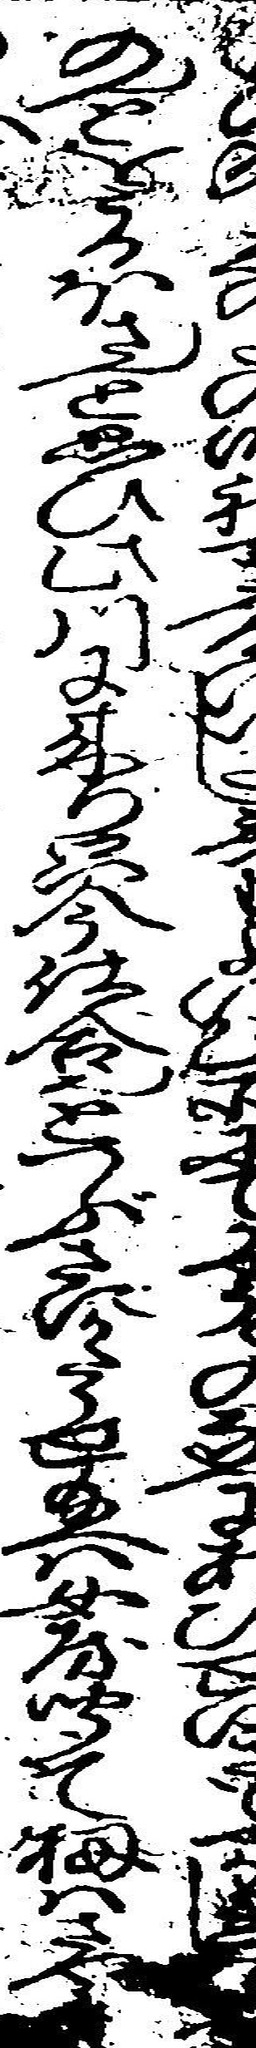のんとをうるほさんと思ひ此川に来り只今仕合也とつぶさにかたらせ給へは女房聞て扨はさやう
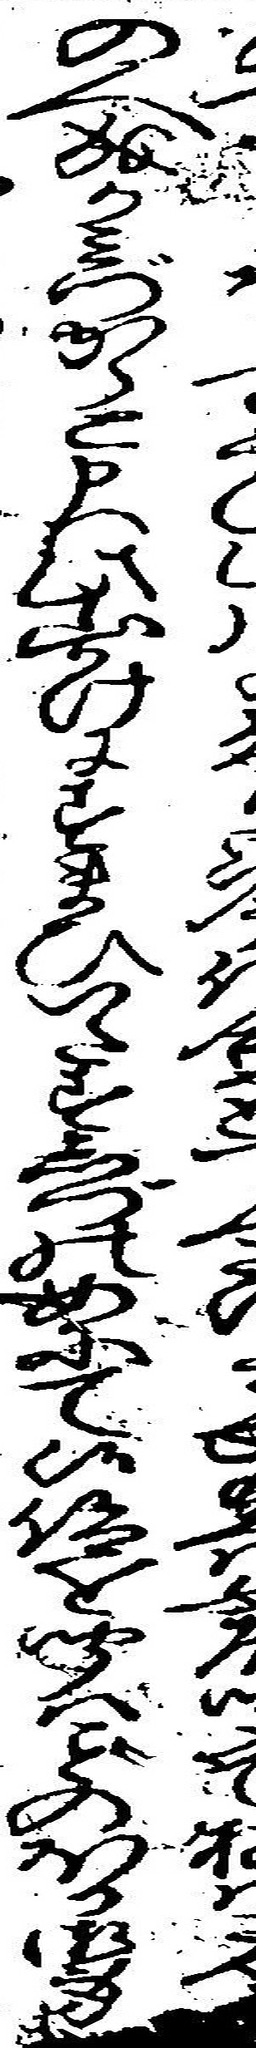の人成かみづからと申は此山かけにすまひいたすしづのめにて候仰を聞はことのほか御身も
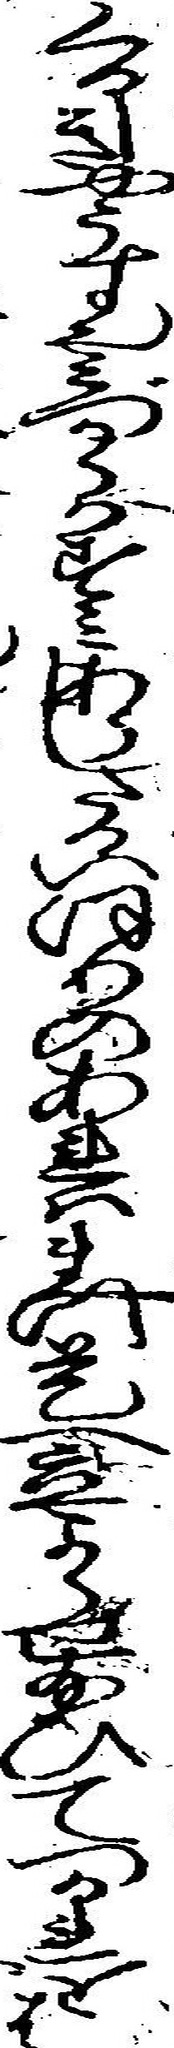くるしきやうす也みづからかすみあらしたるいほりのあれはまつ是へ立よらせ給ひてつかれをは
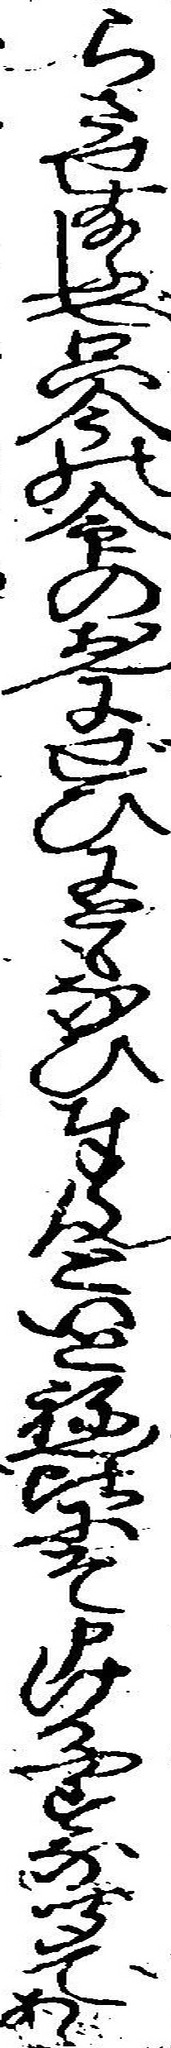らせ給ふべし只今の命のおんにぜひにともなひ奉らんといとねん頃にそ申けるやすな聞てあゝ
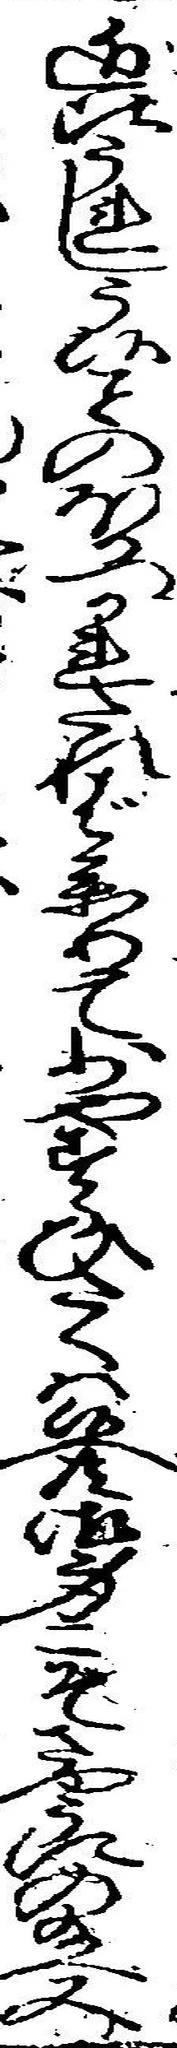近比うれしう候ことのほかつかれたれば参りて少やすらひたくは候へ共御身こそさやうにの給へ又
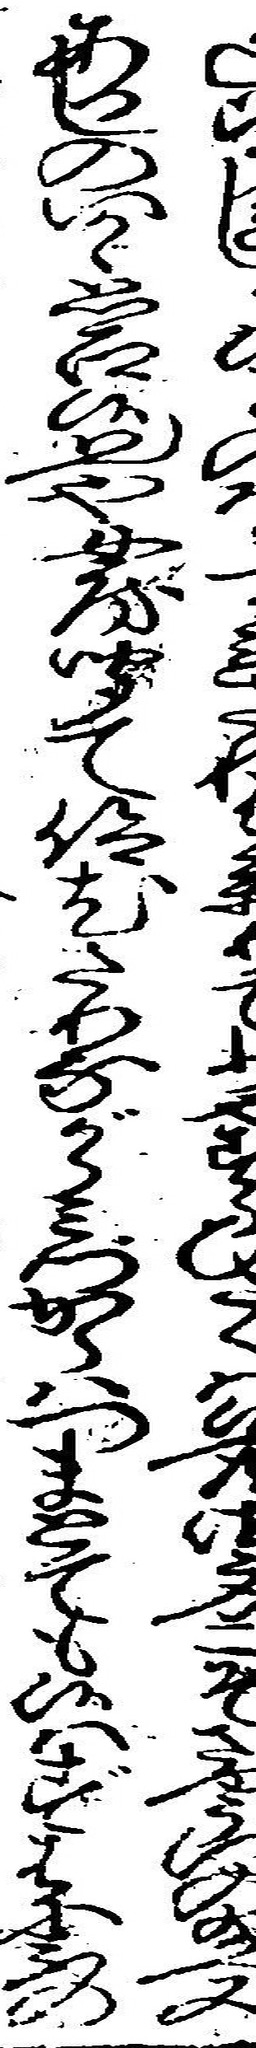あるしのいかゞ思召候はんや女房聞て仰尤さりながらみづからはつまとても候はずはにふの
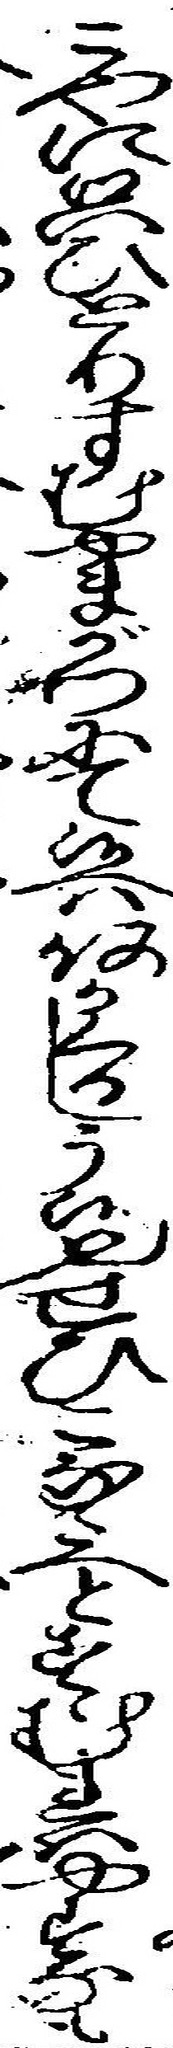こやに只ひとりすむやまがつにて候へは何かくるしう候はんせひこなたへとすゝむれはやすなも
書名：[しのだづまつりぎつね付あべの清明出生]
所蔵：東京大学総合図書館 General Library in the University of Tokyo, JAPAN
